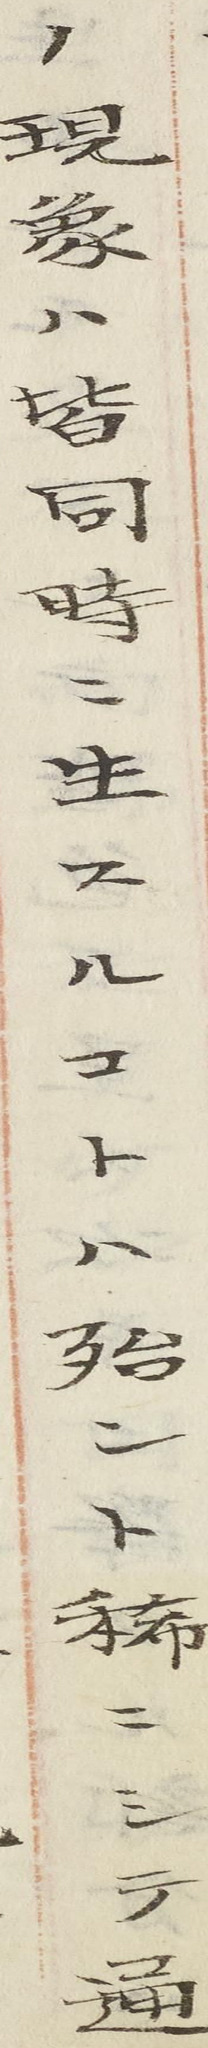ノ現象ハ皆同時ニ生スルコトハ殆ント稀ニシテ通
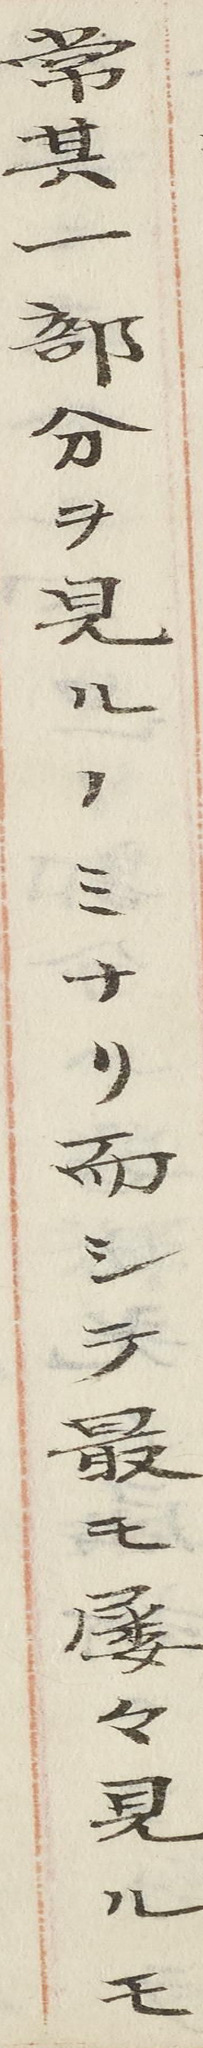常其一部分ヲ見ルノミナリ而シテ最モ屢々見ルモ
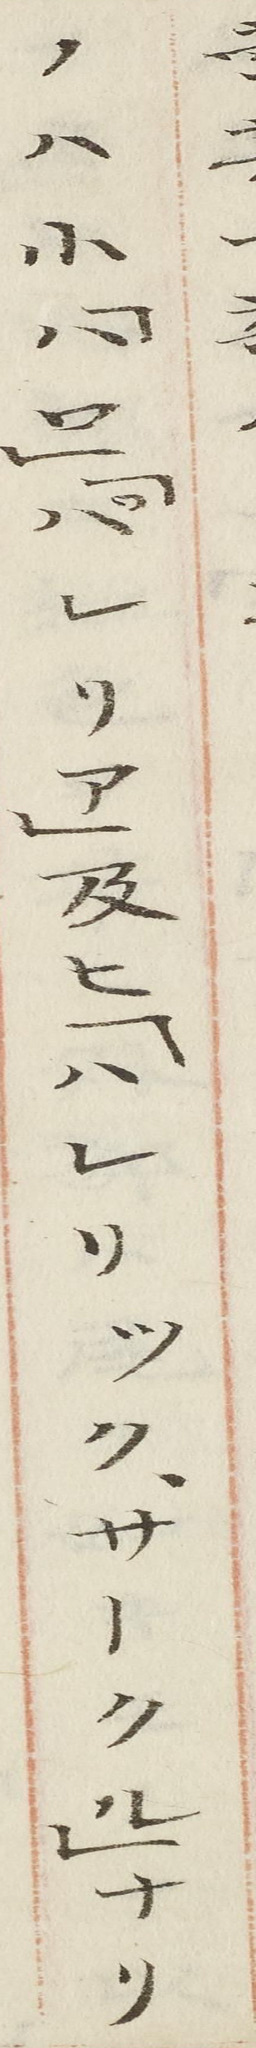ノハ小「ハロ」「パレリア」及ヒ「ハレリック、サークル」ナリ
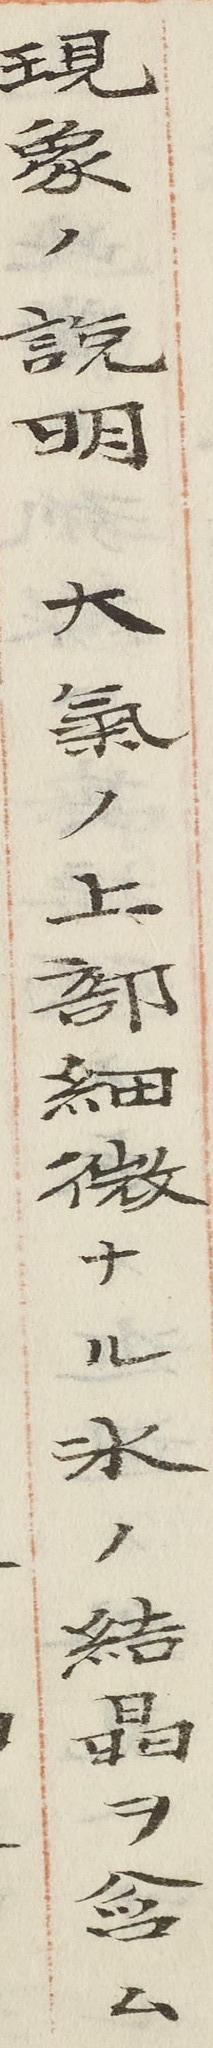現象ノ説明大気ノ上部細微ナル氷ノ結晶ヲ含ム
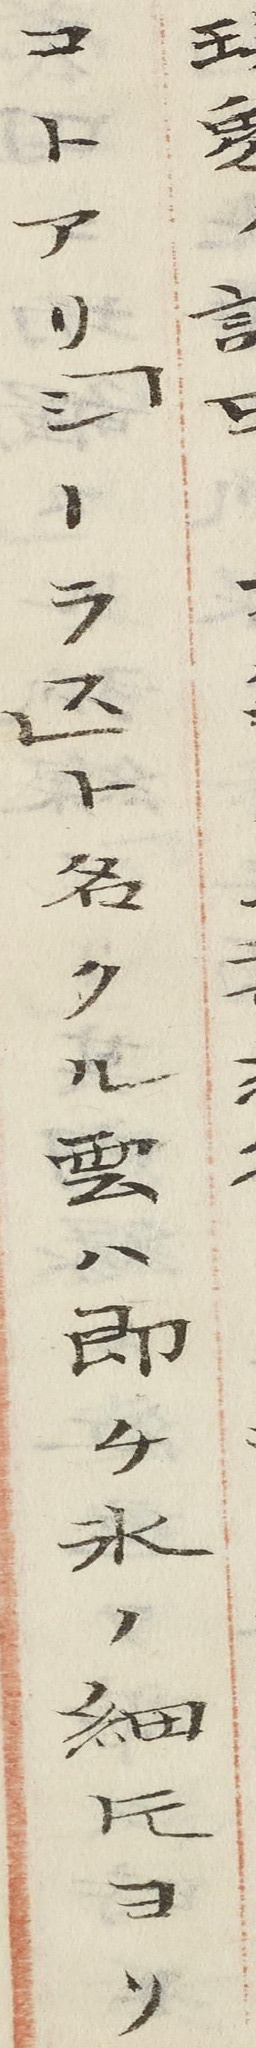コトアリ「シーラス」ト名クル雲ハ即チ氷ノ細片ヨリ
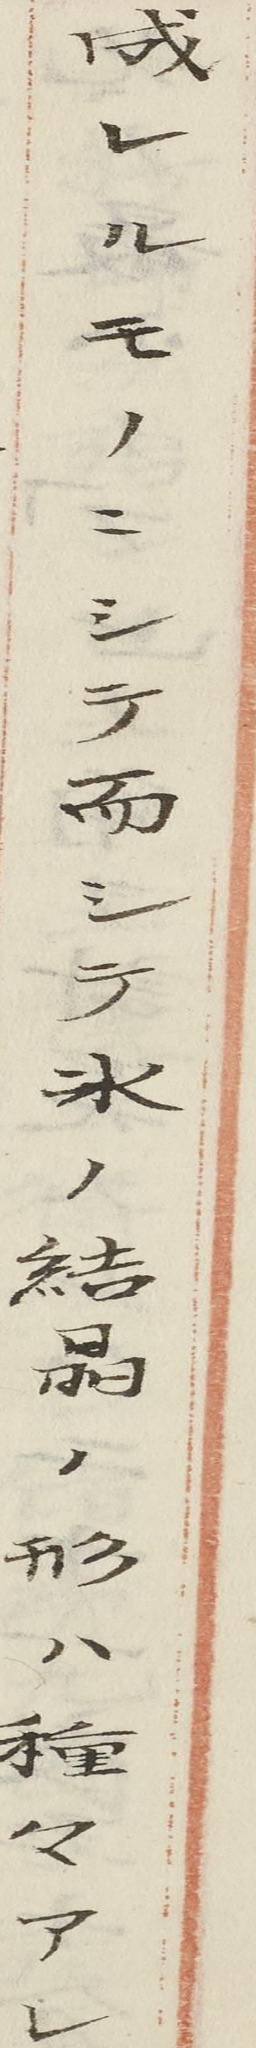成レルモノニシテ而シテ氷ノ結晶ノ形ハ種々アレ
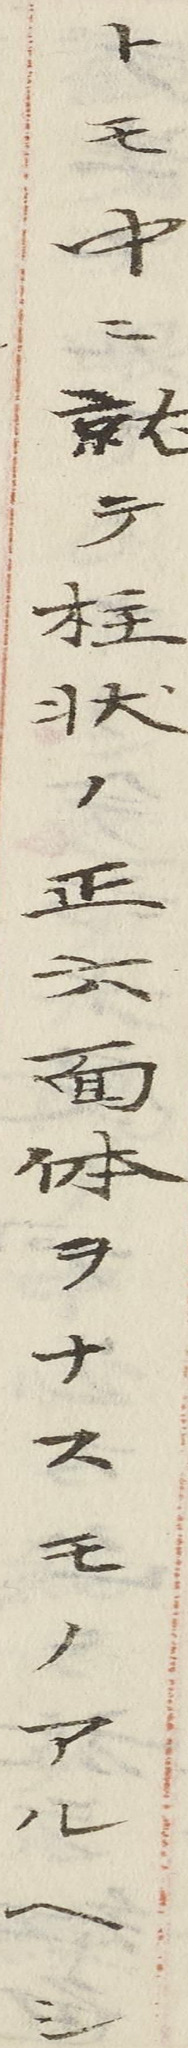トモ中ニ就テ柱状ノ正六面体ヲナスモノアルヘシ
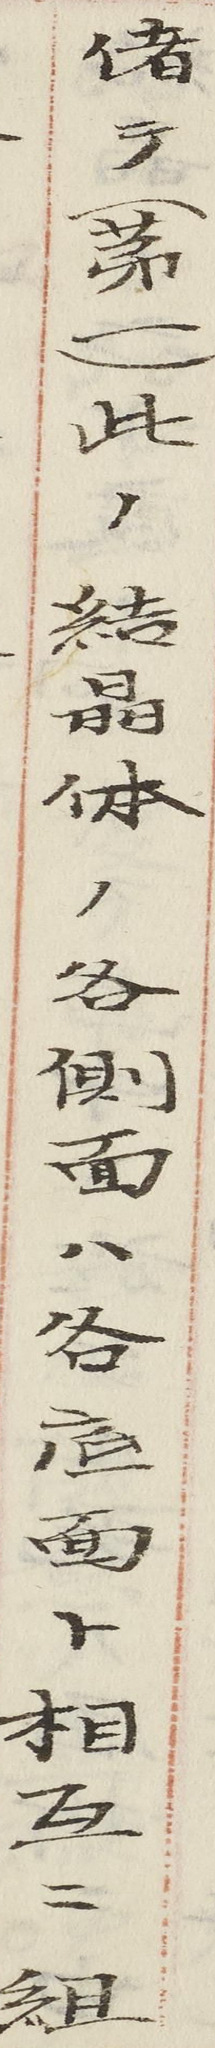偖テ此ノ結晶体ノ各側面ハ各底面ト相互ニ組
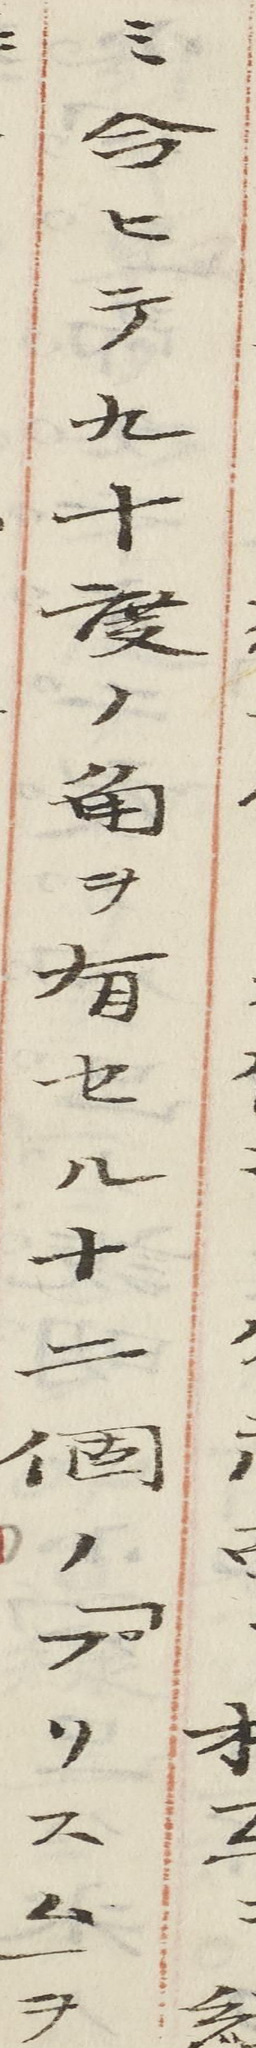ミ合ヒテ九十度ノ角ヲ有セル十二個ノ「プリスム」ヲ
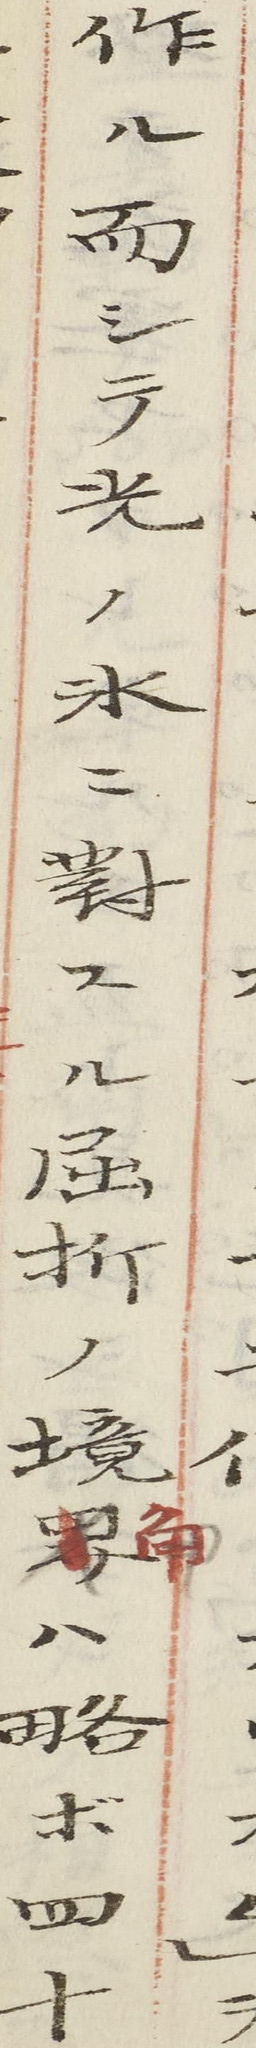作ル而シテ光ノ氷ニ対スル屈折ノ境界ハ略ボ四十
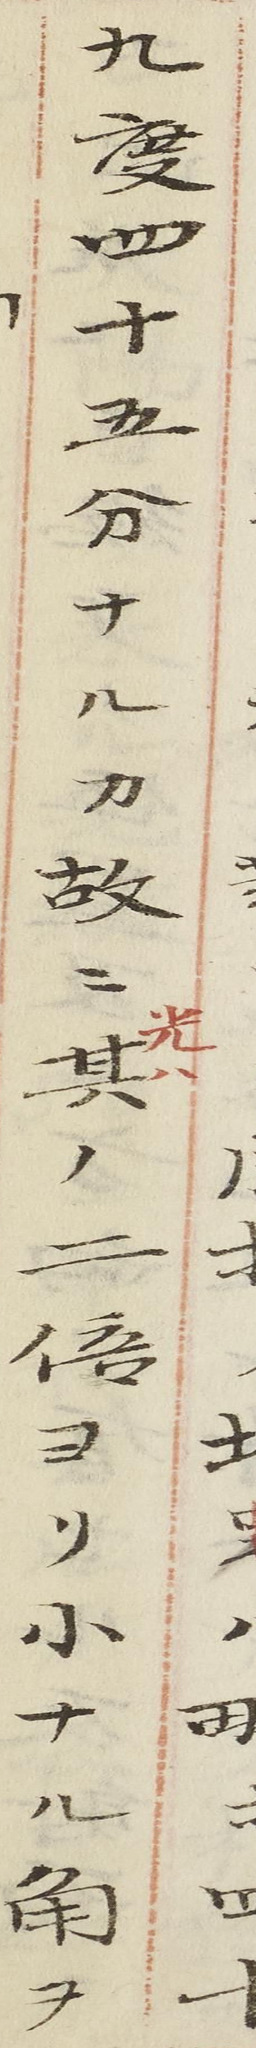九度四十五分ナルカ故ニ其ノ二倍ヨリ小ナル角ヲ
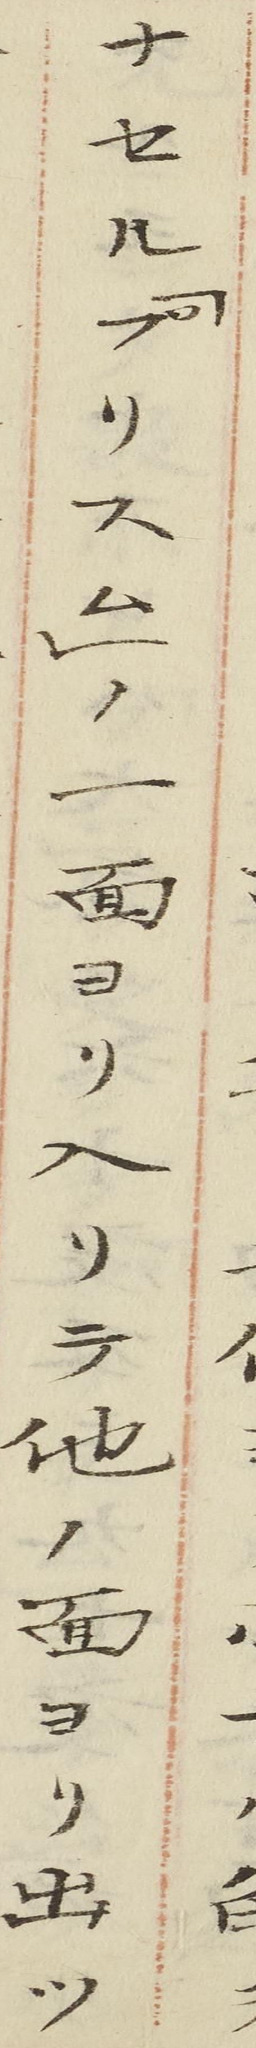ナセル「プリスム」ノ一面ヨリ入リテ他ノ面ヨリ出ツ
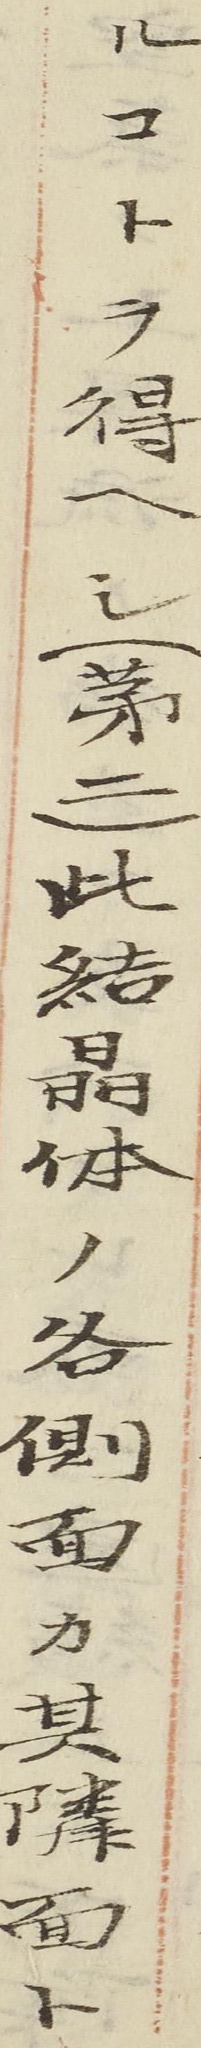ルコトヲ得ヘシ此結晶体ノ各側面カ其隣面ト
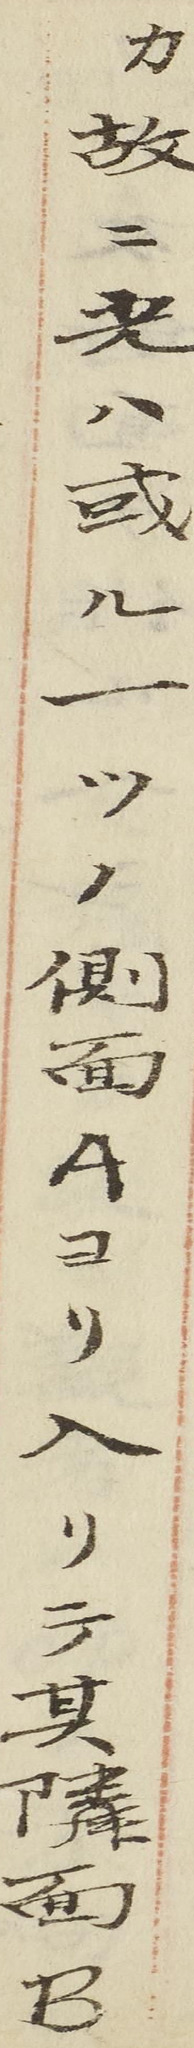カ故ニ光ハ或ル一ツノ側面Ａヨリ入リテ其隣面Ｂ
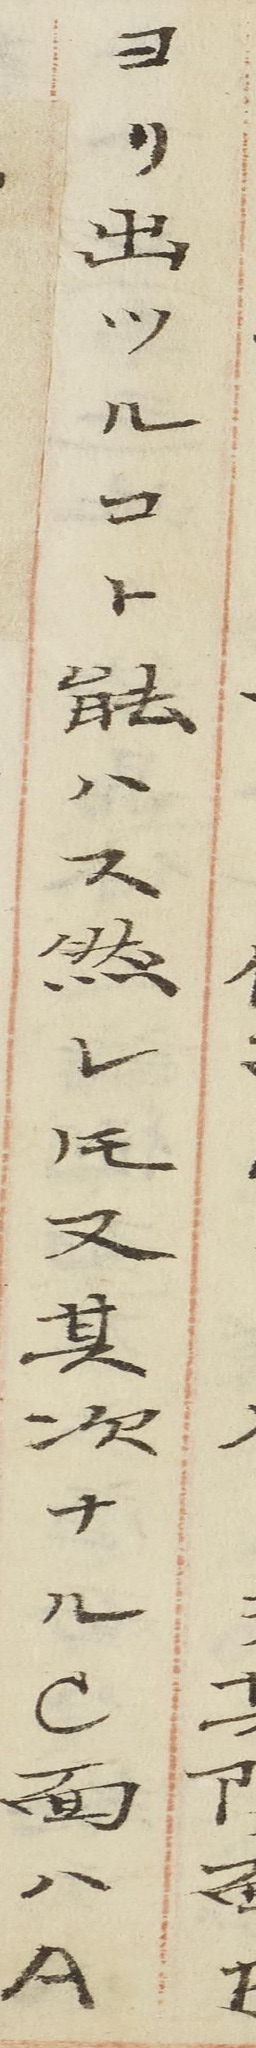ヨリ出ツルコト能ハス然レトモ又其次ナルＣ面ハＡ
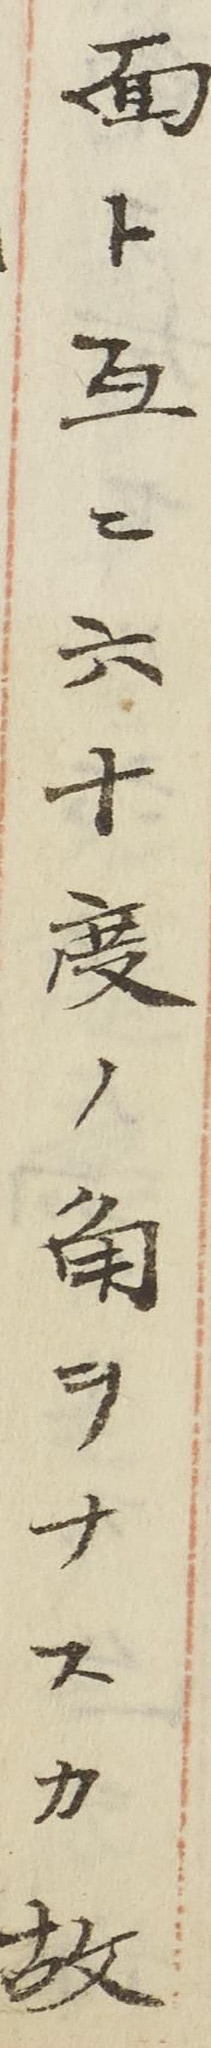第面ト互ニ六十度ノ角ヲナスカ故
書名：虹及ハロノ説明
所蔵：東京大学地震研究所図書室 Earthquake Research Institute Library, The University of Tokyo, JAPAN
